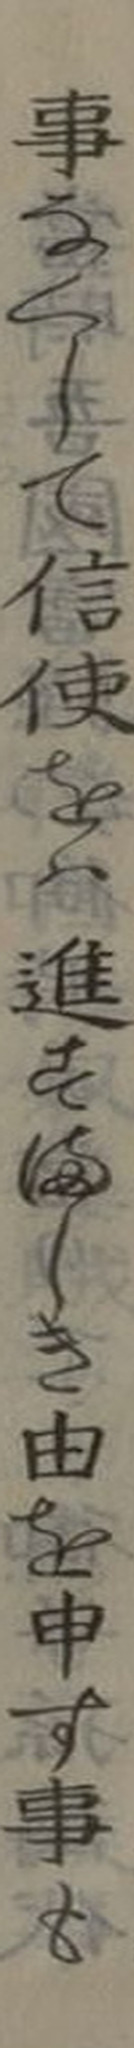事なくして信使をは進すましき由を申す事も
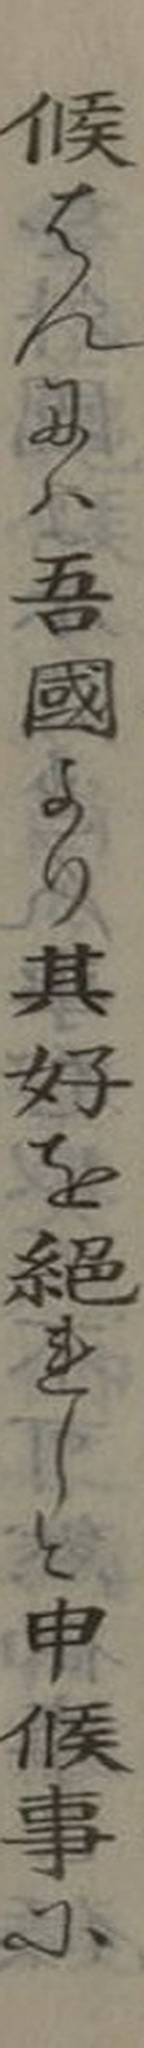候はんには吾國より其好を絕れしと申候事に
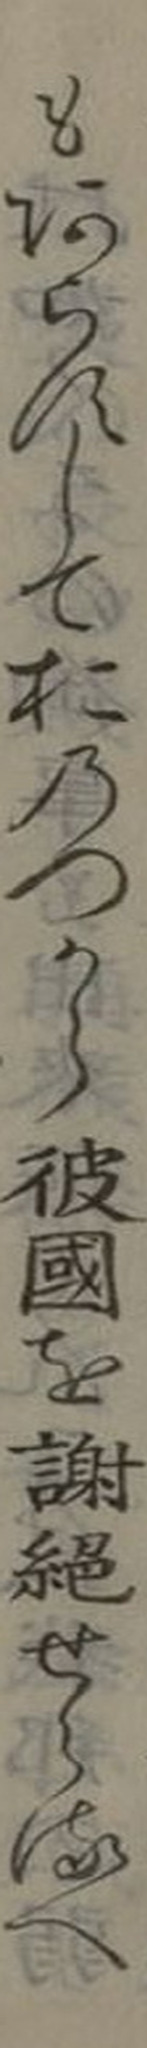もあらすしておのつから彼國を謝絕せらるへ
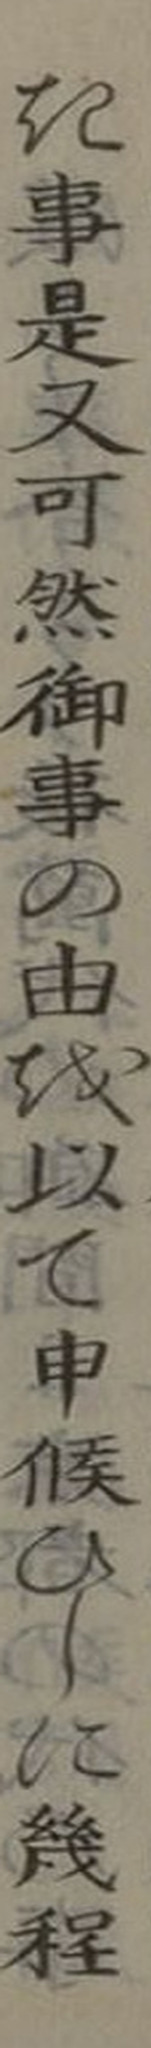き事是又可然御事の由を以て申候ひしに幾程
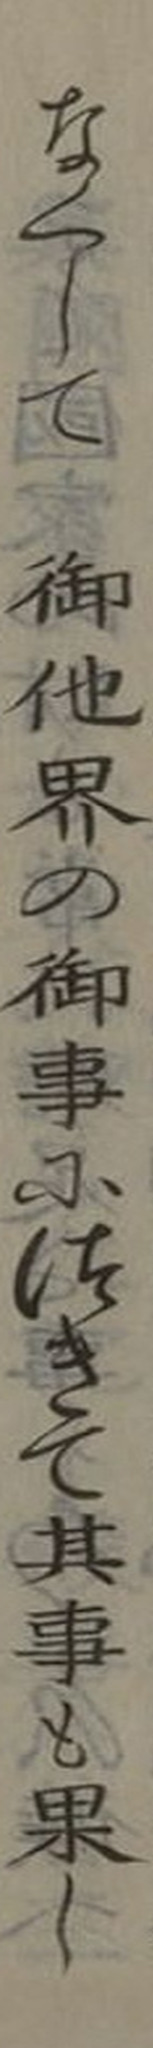なくして御他界の御事につきて其事も果し
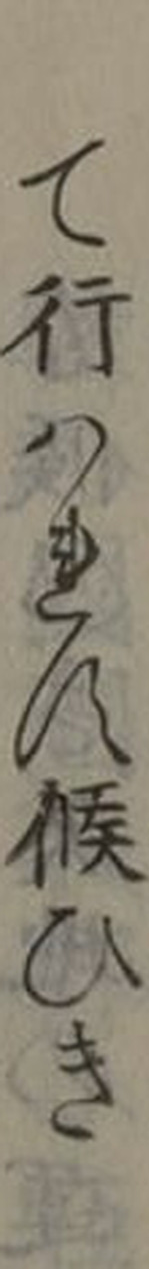て行はれす候ひき
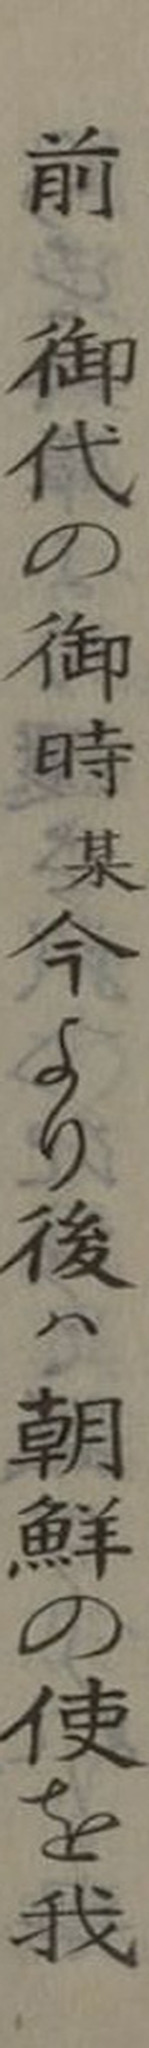前御代の御時某今より後は朝鮮の使を我
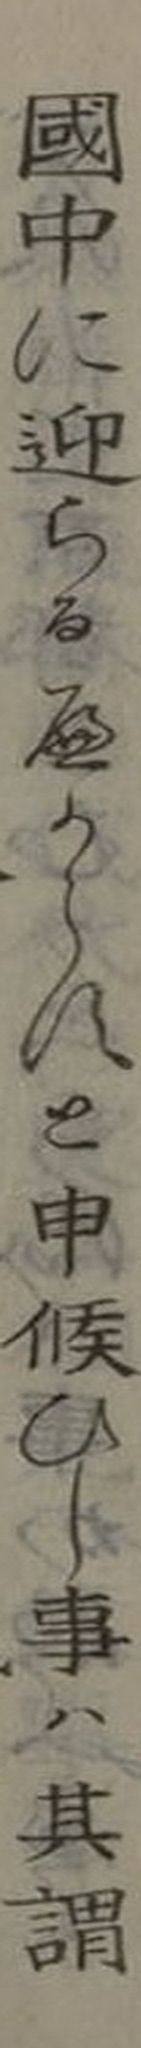國中に迎らるへからすと申候ひし事は其謂
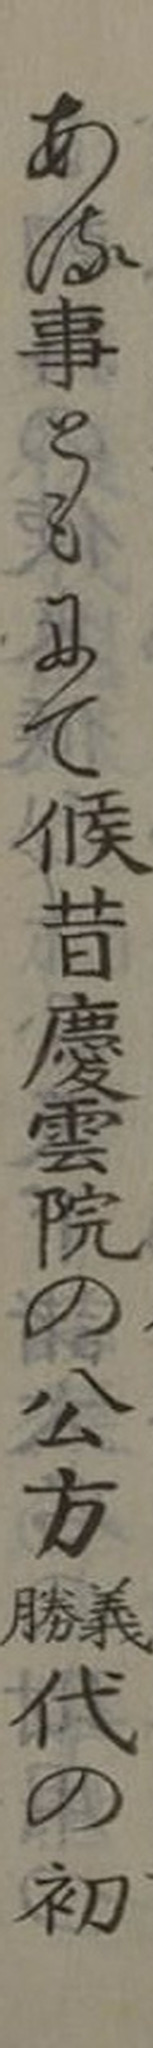ある事ともにて候昔慶雲院の公方義勝代の初

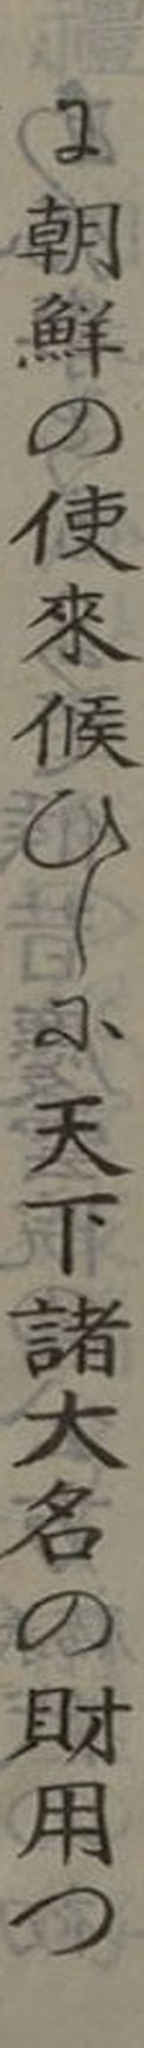に朝鮮の使來候ひしに天下諸大名の財用つ
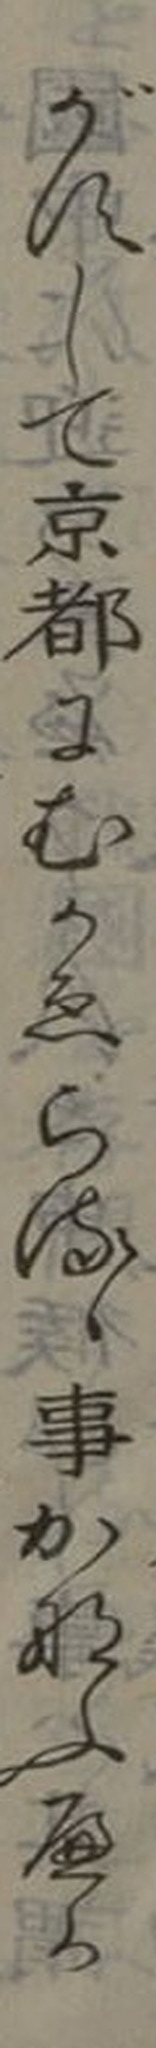がすして京都にむかゑらるゝ事かなふへか
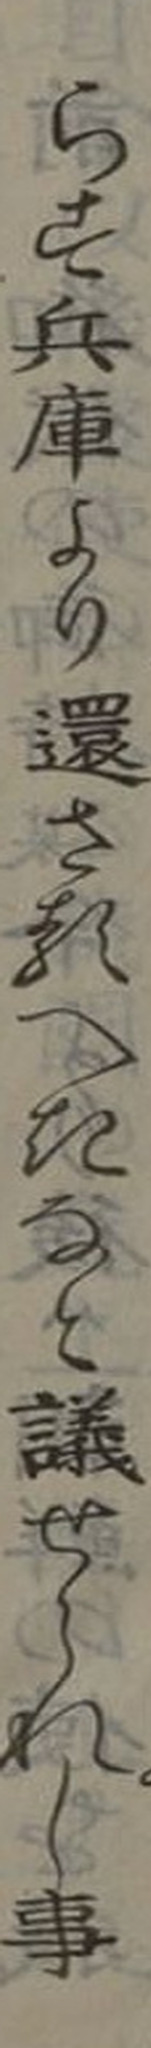らす兵庫より還さろへきなと議せられし事
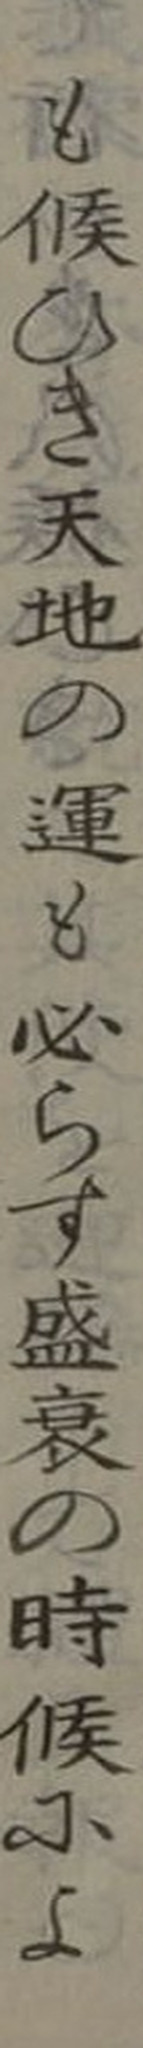も候ひき天地の運も必らす盛衰の時候によ
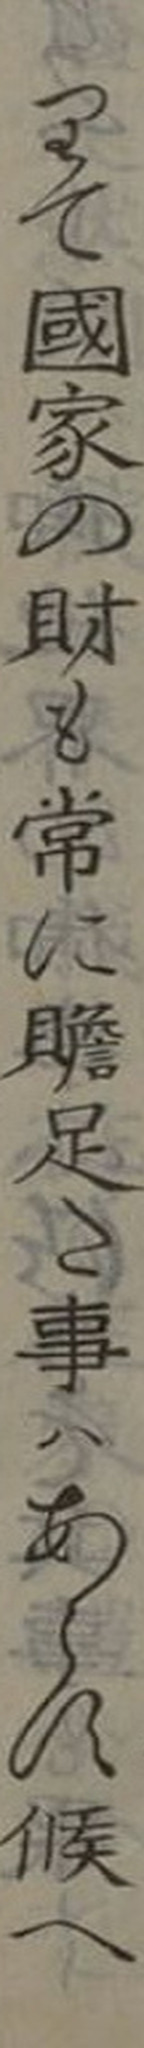りて國家の財も常に贍足た事はあらす候へ
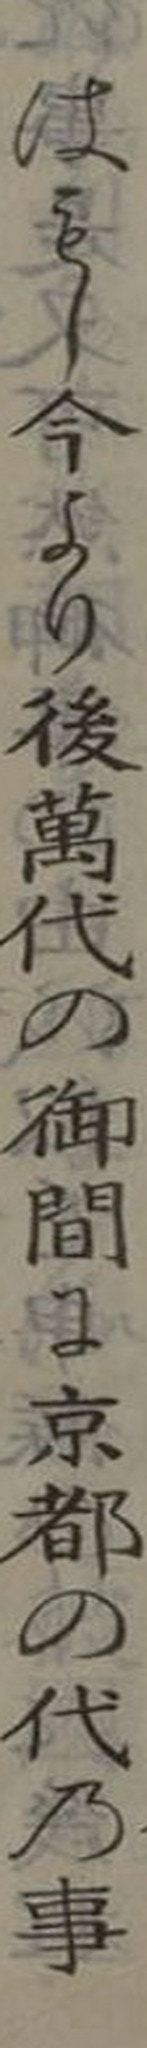はもし今より後萬代の御間に京都の代の事
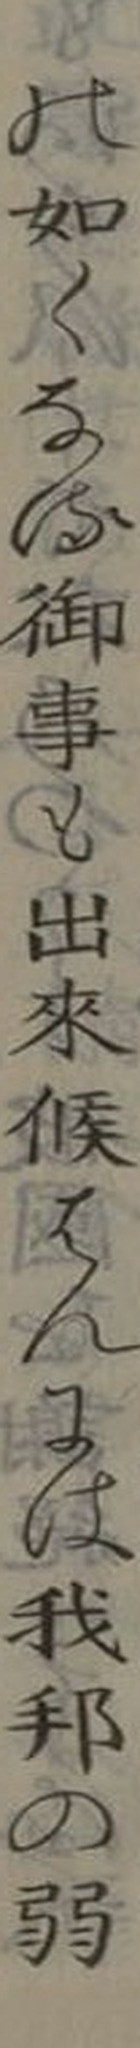の如くなる御事も出來候はんには我邦の弱
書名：骨董録
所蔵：University of the Ryukyus Library
